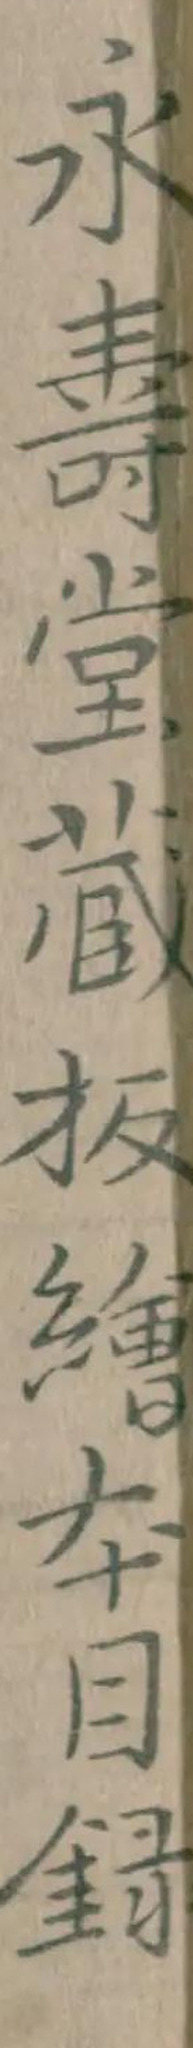永壽堂蔵板繪本目録
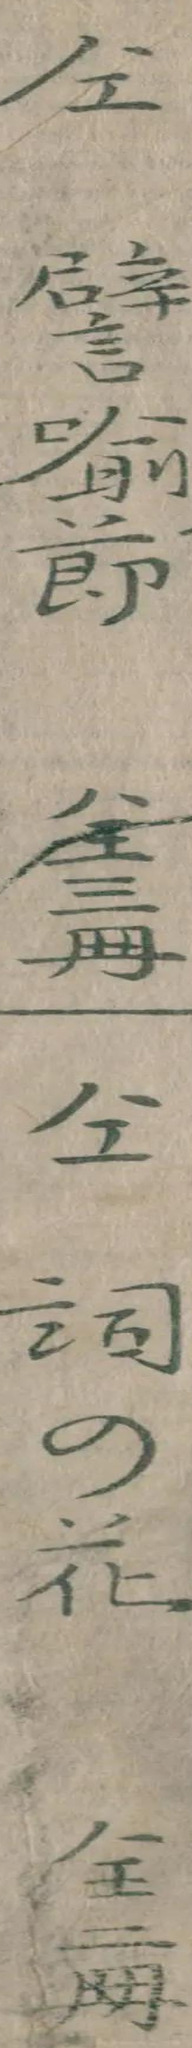仝譬喩節全三冊仝詞の花全三冊
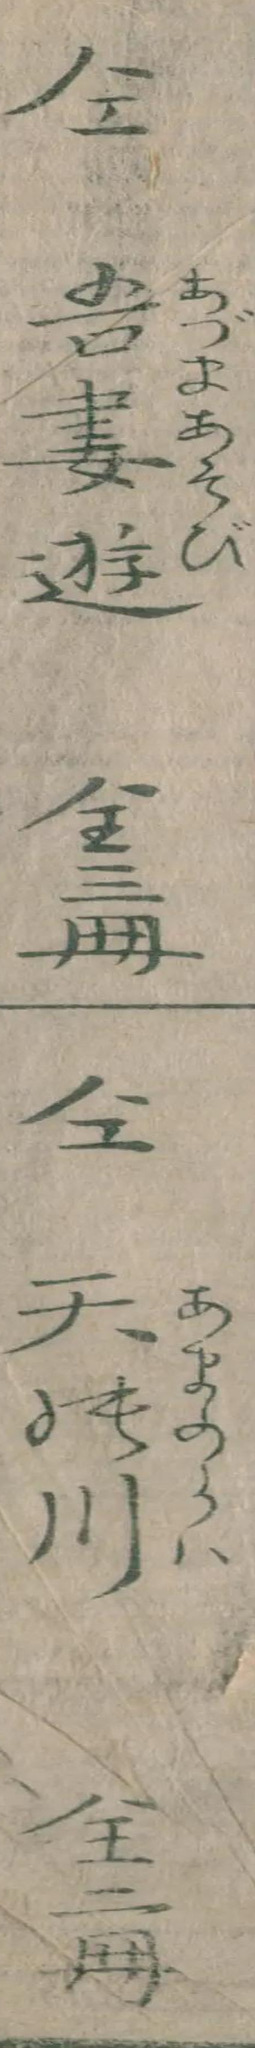仝吾妻遊全三冊仝天能川全三冊
